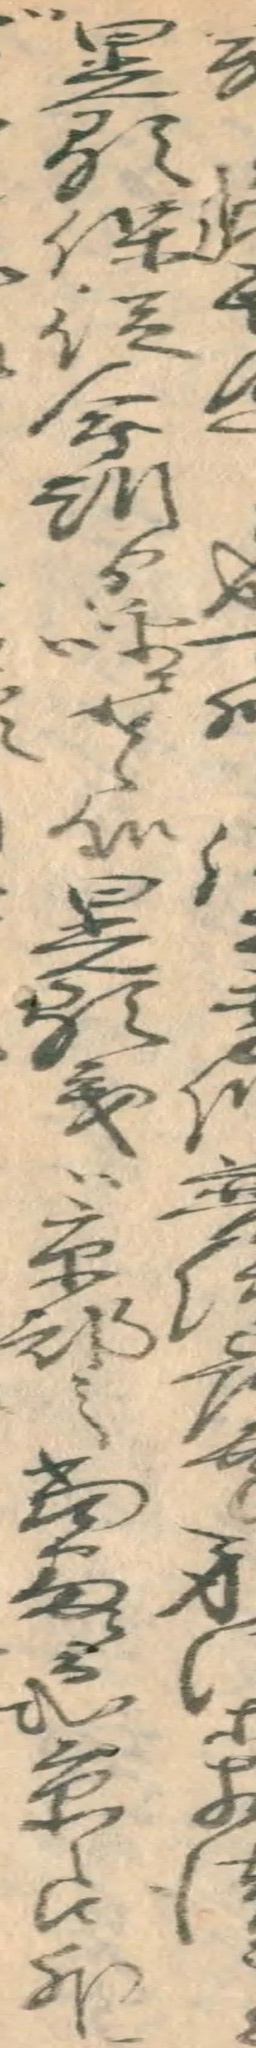晃顕保従会所ゟ呼ニ遣候処晃顕義ハ京都之当番ニ而出京之由外ニ
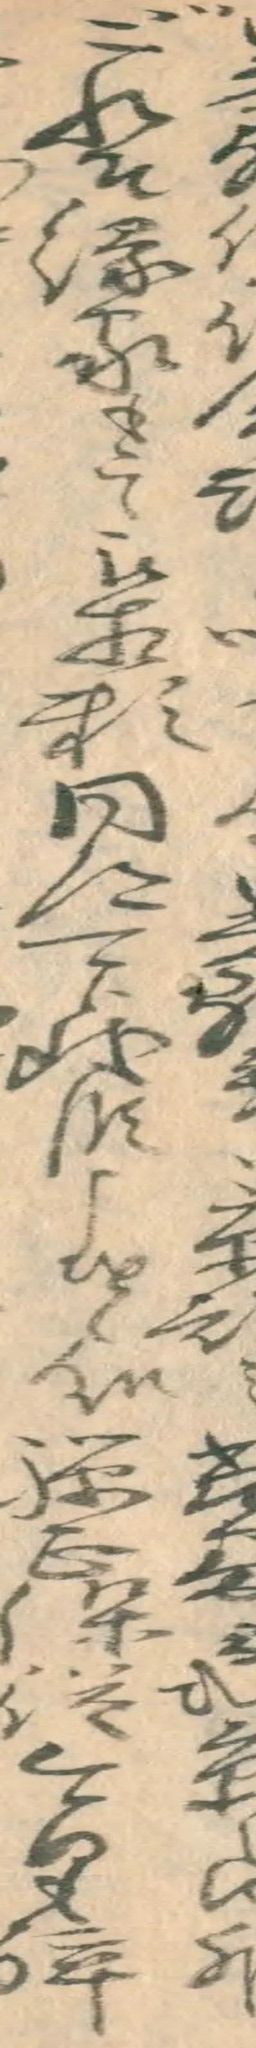どれそ縁家も候ハヽ被相頼同道可被致段申遣候処弾正保従今日も酔
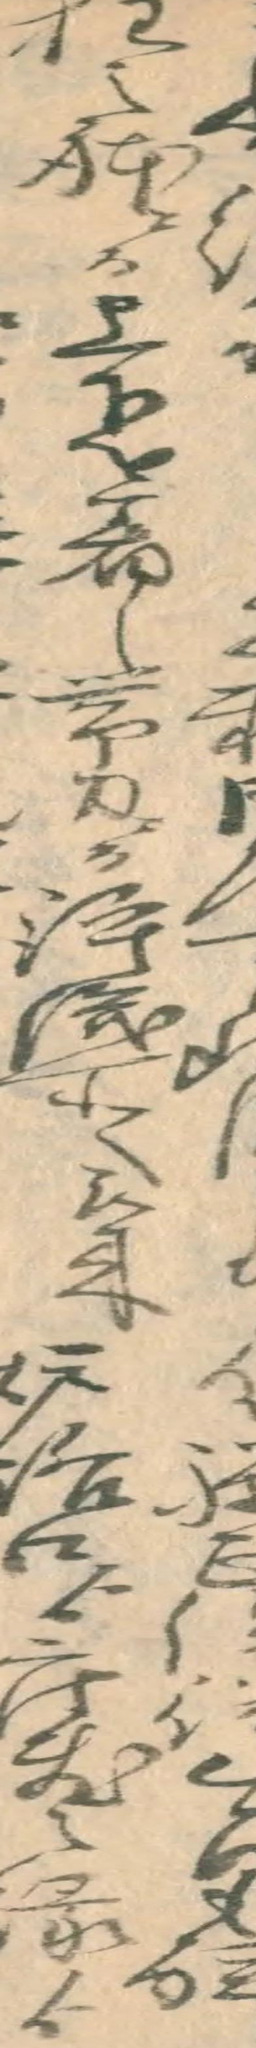狂之体ニ而上下を着し帯力ニ而評議所へ被来炉路口ゟ座敷之縁ゟ
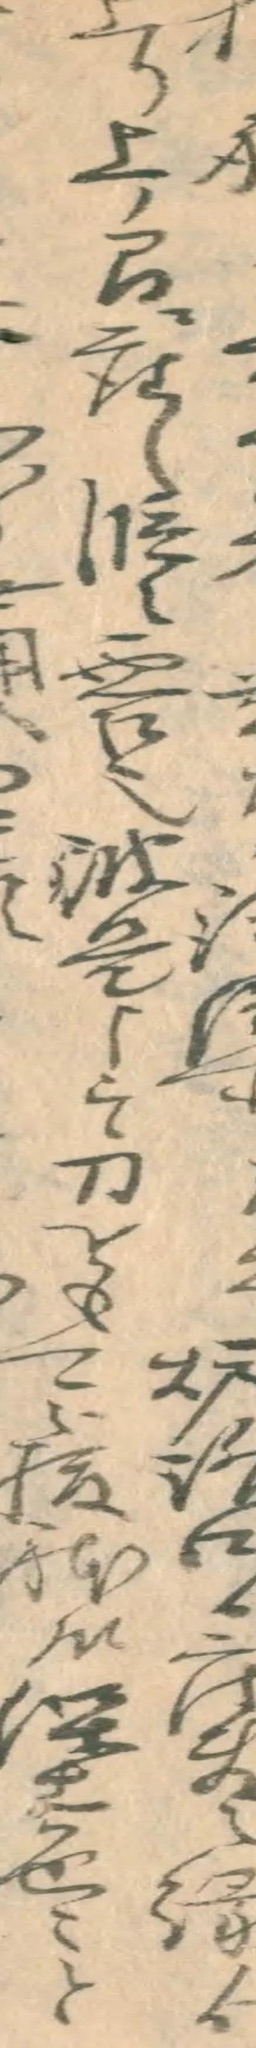上り上ノ間ニ座し段々悪口也彼是申上候刀をも可被抜体故保土色々と
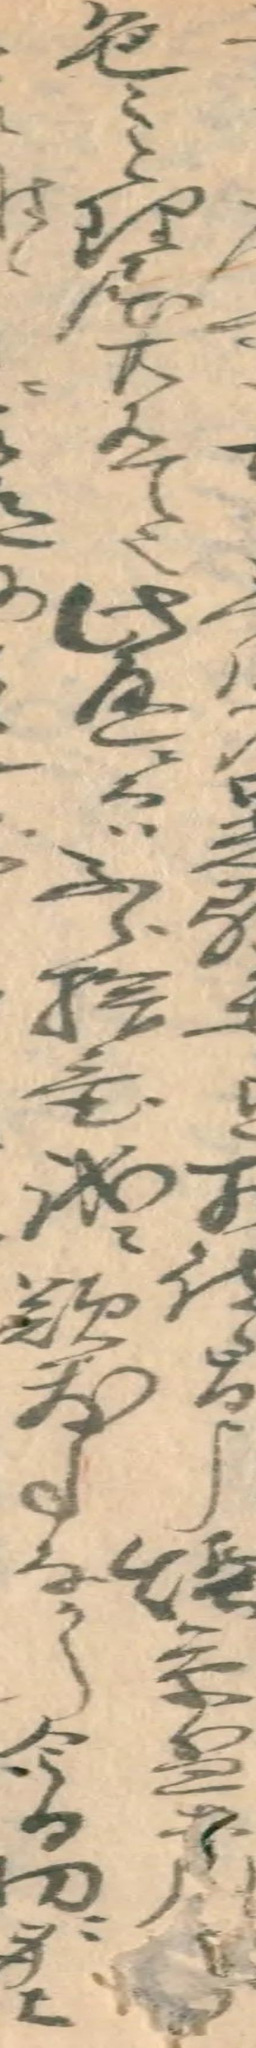色々と理屈共有之也此通ニ而ハ不被捨置誠ニ歎敷事なから今日切ニ身上
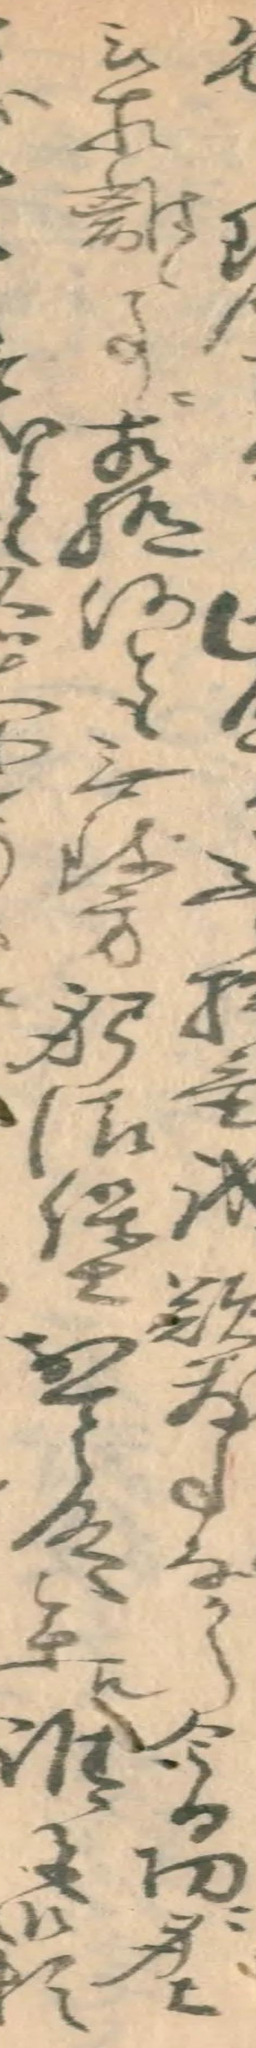被相離候事ニ相極何とも無致方躬清保土おてら殿へ参ル誰ニても御頼
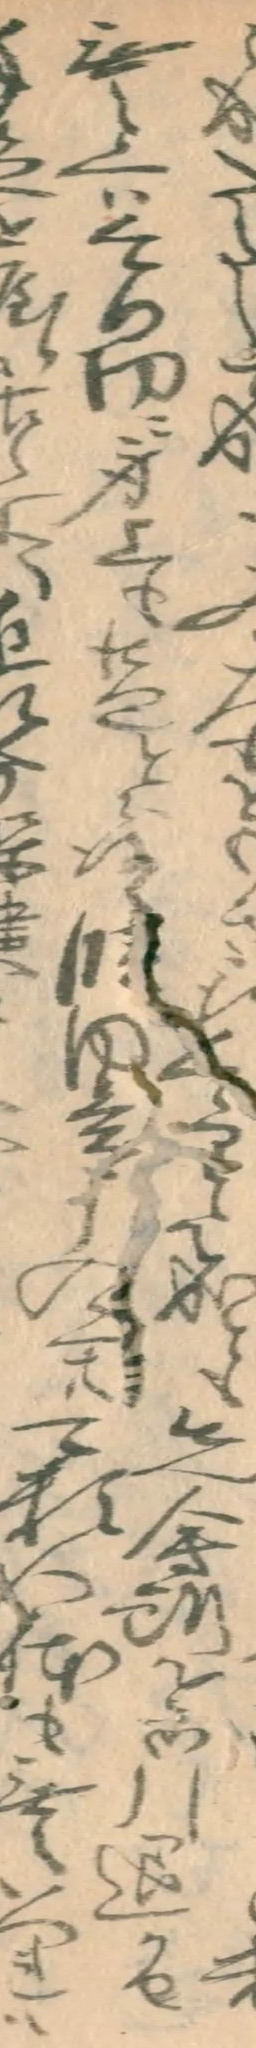無之候へハ今日切ニ身上も仕廻と被存候段内意申入候へ共可頼人体も無之いつれも
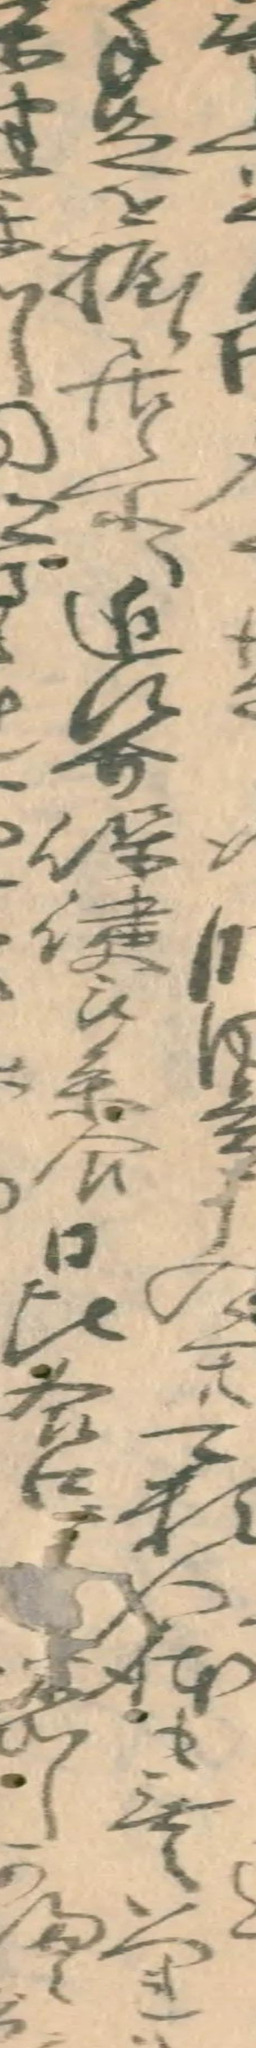手足を握り居候所へ近江介保健被参合日比合口ニ出し可帰之旨ニ而
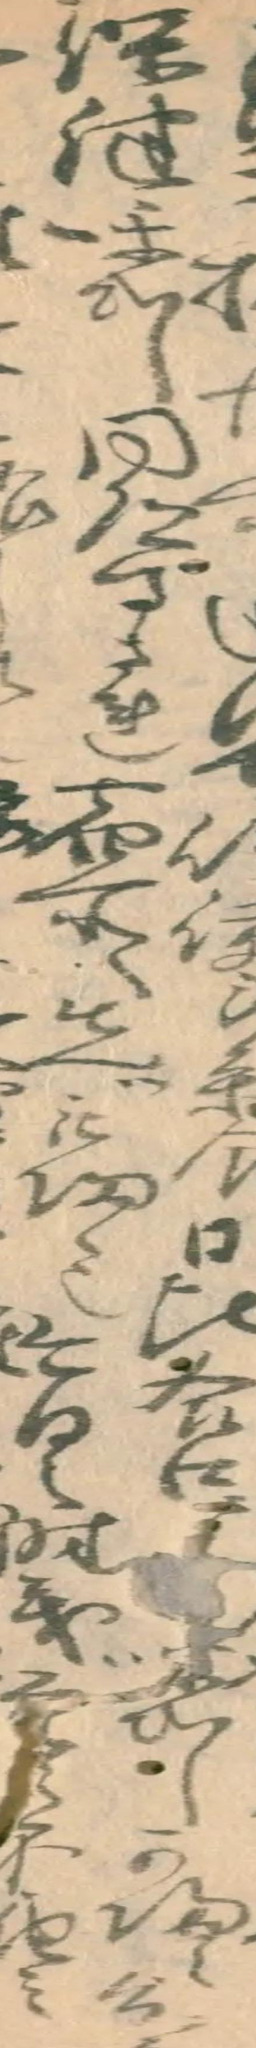保健呼出し同道され宿所へ先ツ被帰候也今日之時義ハ重々不届之
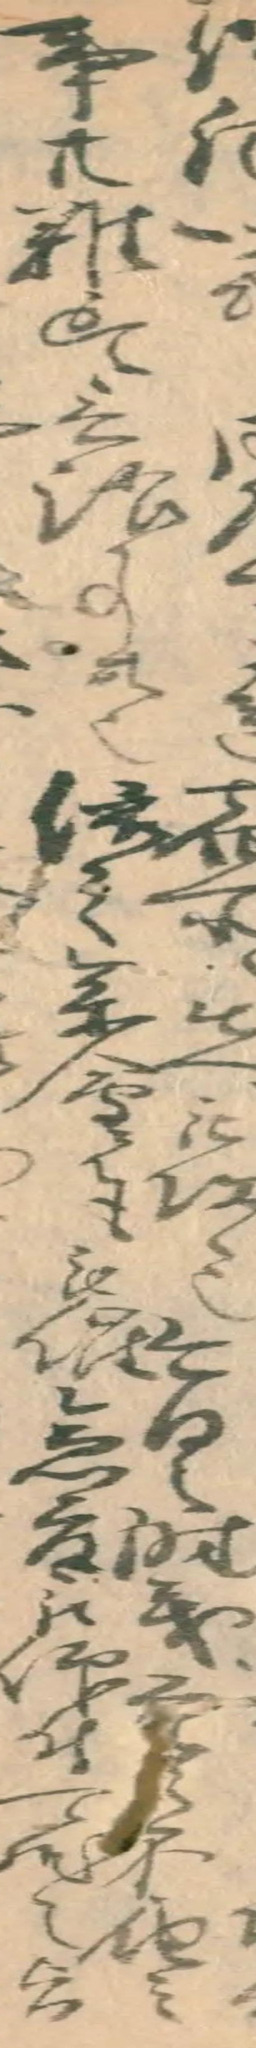事共難尽言語事共也依之参会ニても被催急度被仰付可然之旨
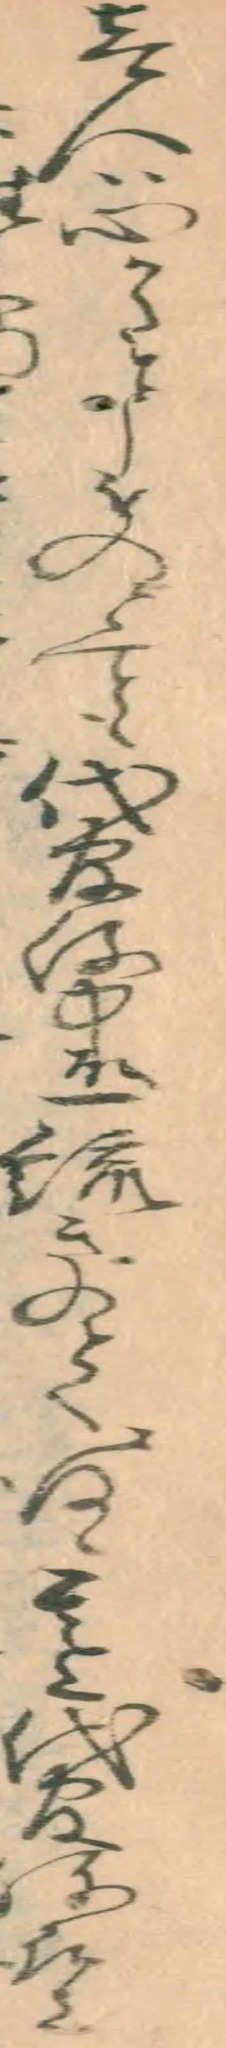壱人ハ心かたと申ものに候へとも代官役中故一統きのとくに存候其上代官役取上
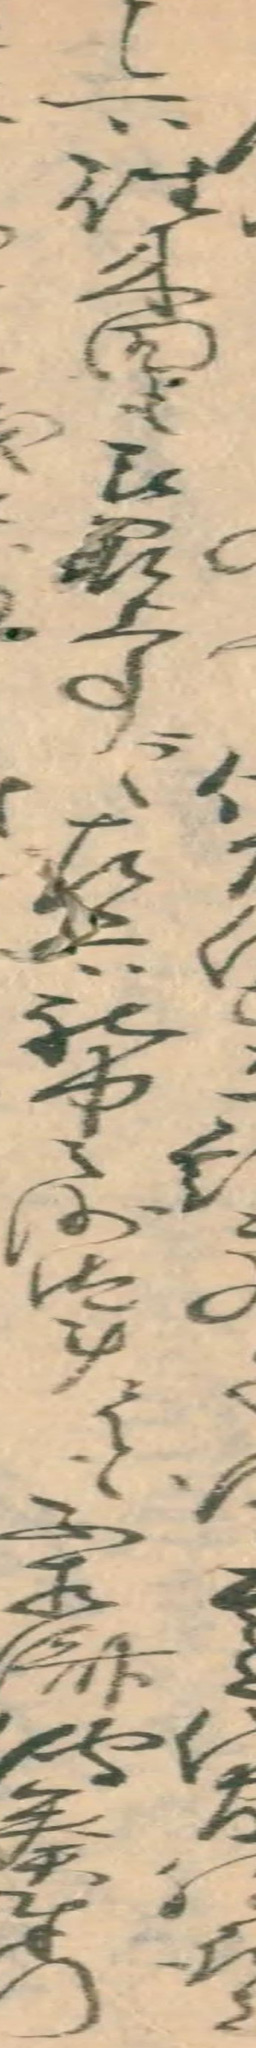申候へハ往来田も被召上事ニ候左候ヘハ社中之沙汰計ニても不相済伝奏奉行
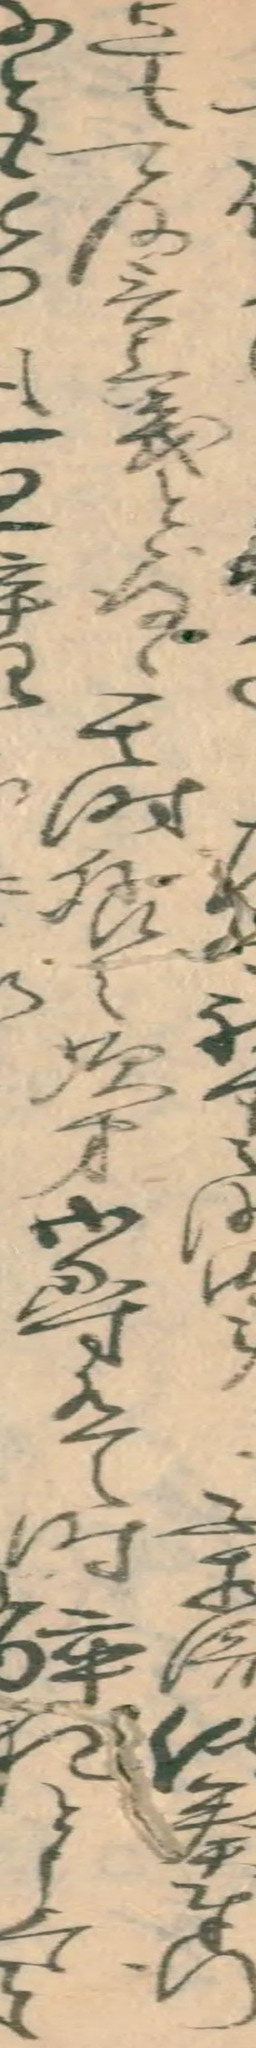迄も可及言上義と被存候其時咎之次第御尋有之時酔狂と申上候ても
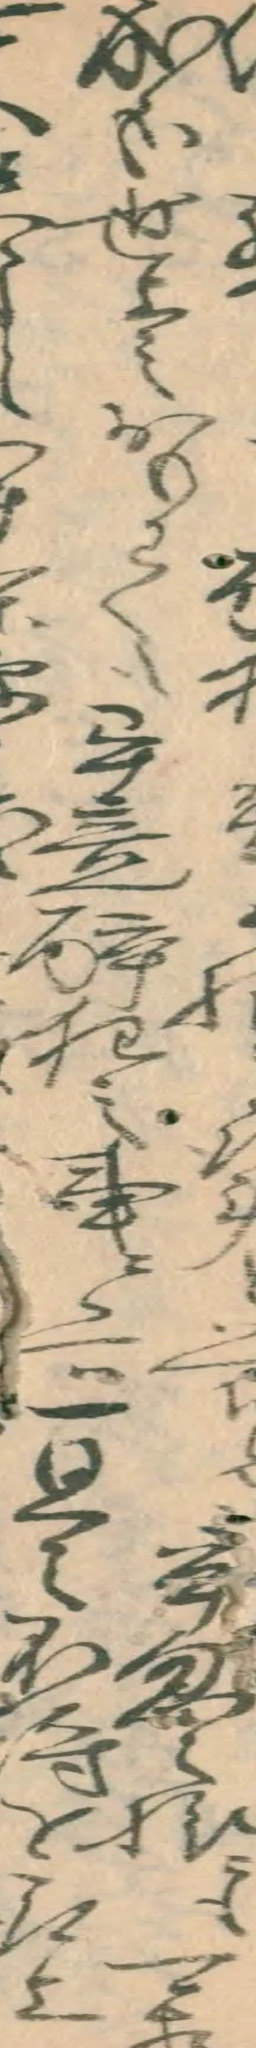成哉世上之おもわくも畢竟酔狂之事ニ候へハ一旦之不埒を取上
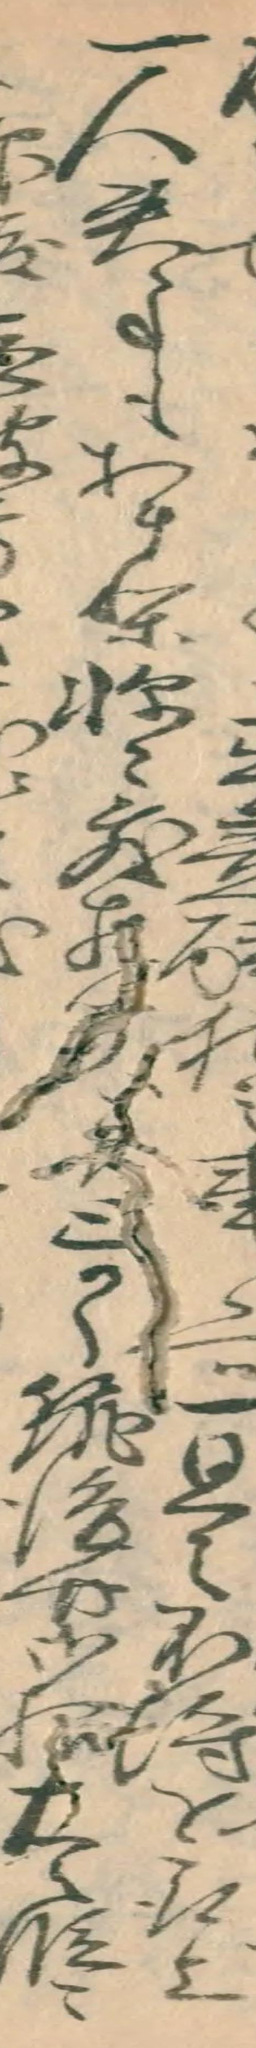一人失候事もあまり軽々敷相聞とかく筑後介御招右之段々
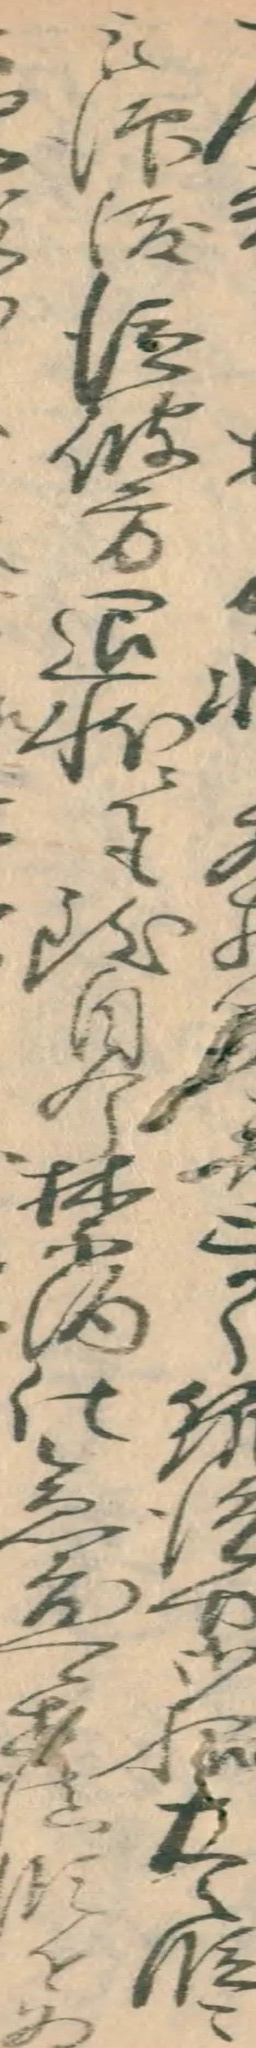被仰渡従彼方退状ニても致自今禁酒仕急度可相慎段を為
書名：賀茂社記録. 第58冊
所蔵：国立国会図書館 National Diet Library, JAPAN
